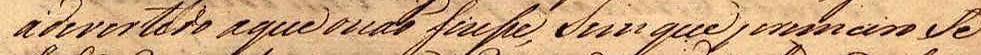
adevertido a que o naõ fizesse, sem que primeiro Se
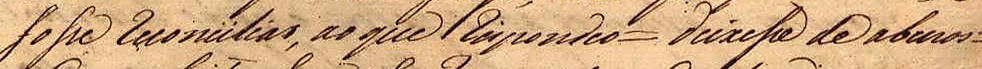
fosse Reconciliar, ao que Respondeo = deixesse de abusos
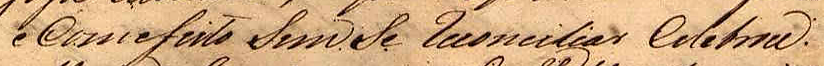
e Com efeito Sem se Reconciliar Celebrou.
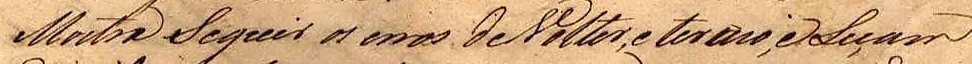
Mostra Seguir os erros de Volter, e ter uso, e Leçam
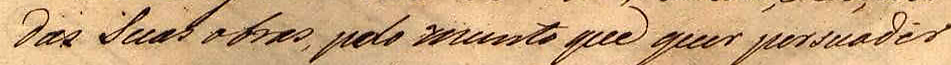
das Suas obras, pelo munto que quer persuadir
